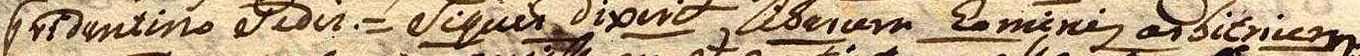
Tridentino se diz.= si quis dixerit Liberum hominis arbitrium
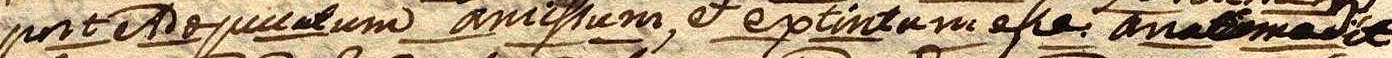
post Adae peccatum amissum, et extintum esse: anathema sit
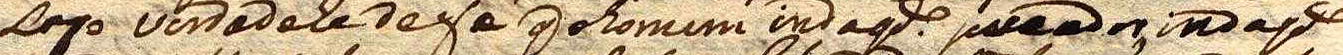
Logo verdade he dese q̄ homem inda qd.o peccador inda qdo
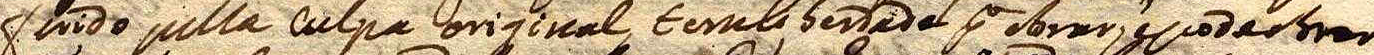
ferido pella culpa original, tem liberdade pa obrar, e pode obrar
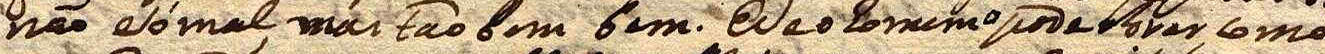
não só mal, mas tãobem bem. E se o homem o pode obrar, como
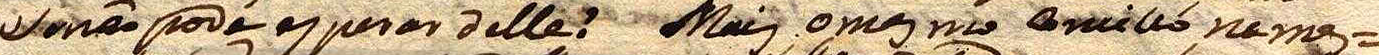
se não pode esperar delle? Mais o mesmo Concilio, na mes
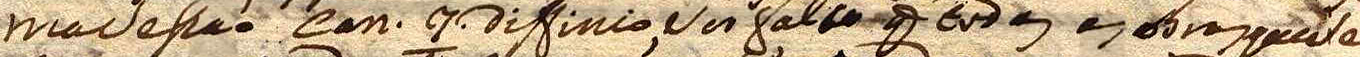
ma sessaõ can. 7. diffinio ser falco q̄ todas as obras que se
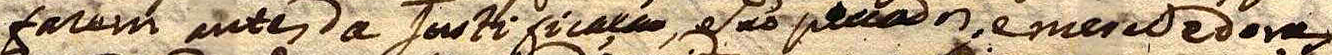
fazem antes da Justificação, saõ peccados, e meresedoras
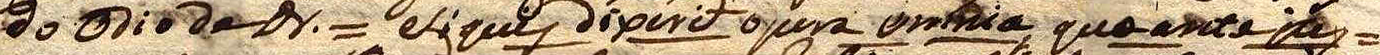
do Odio de Ds. = si quis dixerit opera omnia quae ante jus
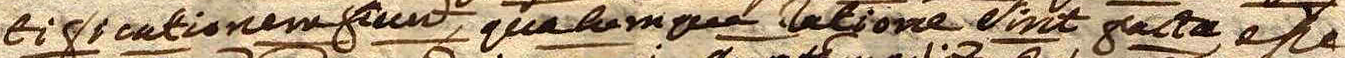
tificationem fiunt, quacumque Ratione sint facta, esse
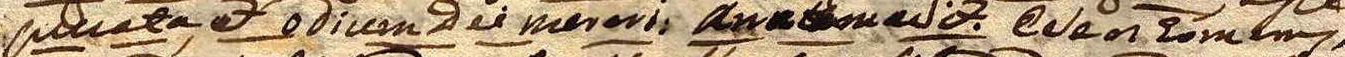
peccata, et odium Dei mereri: anathema sit. E se os homens,
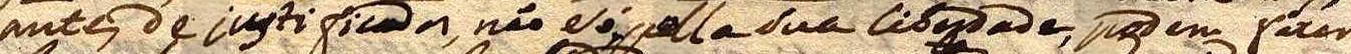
antes de justificados, não só pella sua Liberdade, podem fazer
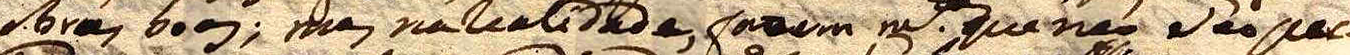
obras boas; mas na Realidade, fazem m.tas que naõ são pec
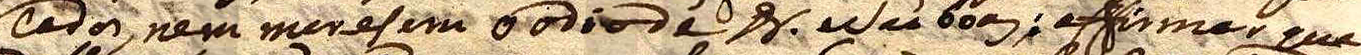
cados, nem meresem o odio de Ds. e são boas; affirmar que
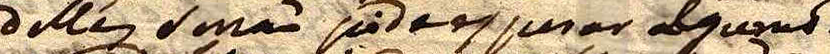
delles senaõ pode esperar algums
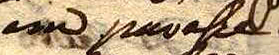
em pasasse
